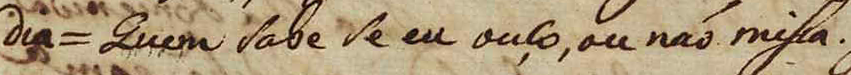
dia = Quem sabe se eu ouço, ou naõ missa.
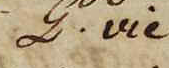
Q.do vie
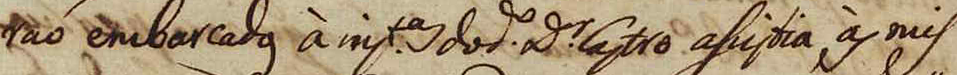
raõ embarcados à inst.as do d.o D.r Castro assistia às mis
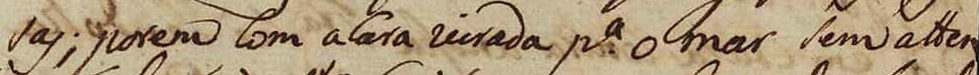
sas; porem com a Cara virada p.a o mar sem atten
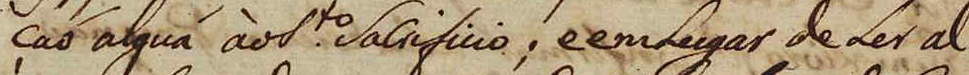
çaõ alguā ào S.to Sacrificio; e em Lugar de Ler al
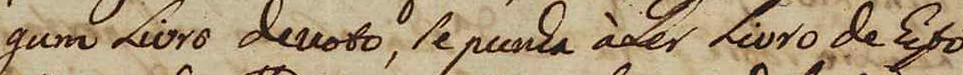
gum Livro deuoto, se punha à Ler Livro de histo
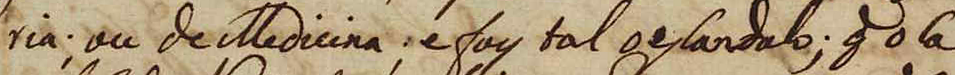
ria; ou de Medicina; e foy tal o escandalo; q̄ o Ca
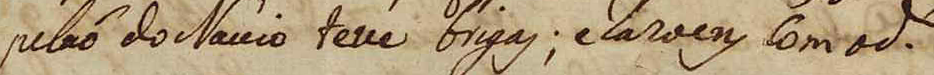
pelaõ do Nauio teve brigas; e Razoens com o d.o
